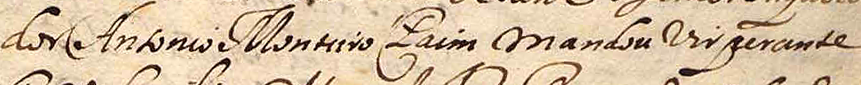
dor Antonio Monteiro Paim mandou vir perante
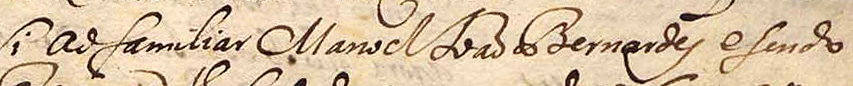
si ao familiar Manoel Ioaõ Bernardes e sendo
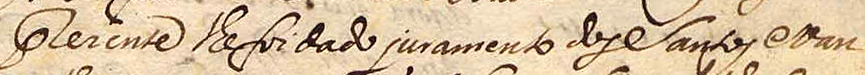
prezente lhe foi dado juramento dos Santos evan
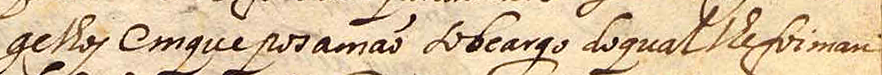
gelhos em que pos a maõ sob cargo do qual lhe foi man
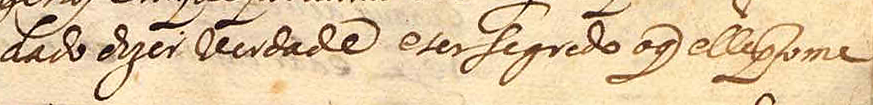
dado dizer verdade e ter segredo o q̄ elle prome
